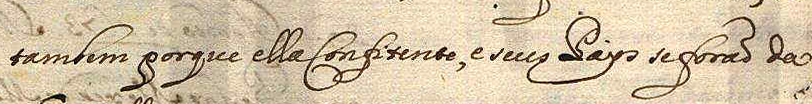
tambem porque ella Confitente, e seus Pays se foraõ da
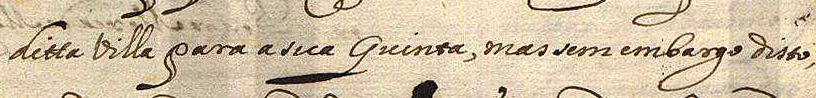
ditta Villa para a sua Quinta, mas sem embargo disto,
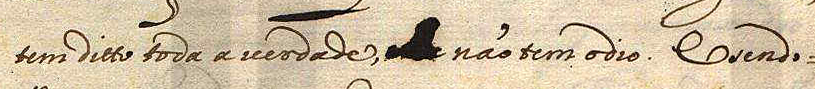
tem ditto toda a uerdade, e naõ tem odio. E sendo
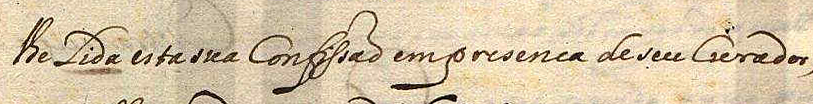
lhe Lida esta sua Confissaõ em presença de seu Curador
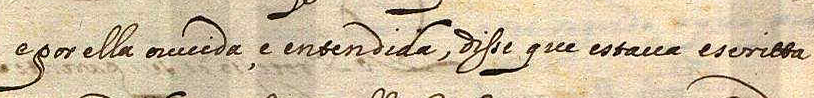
e por ella ouuida, e entendida, disse que estaua escritta
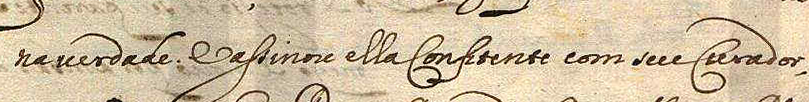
na uerdade. E assinou ella Confitente com seu Curador
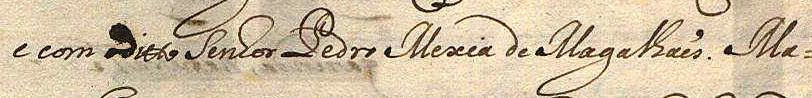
e com o ditto Senhor Pedro Mexia de Magalhaẽs, Ma
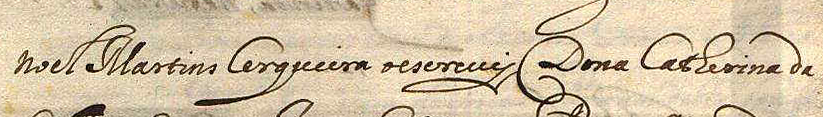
noel Martins Cerqueira o escreuy. Dona Catherina da
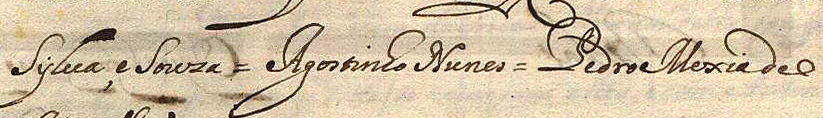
Sylua, e Souza = Agostinho Nunes = Pedro Mexia de
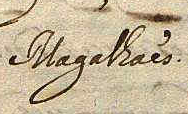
Magalhaẽs.
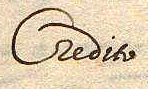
Credito
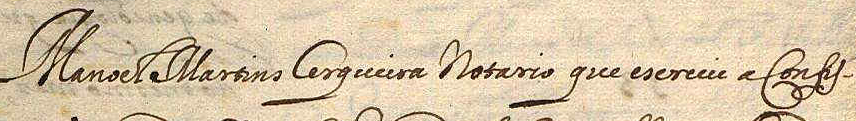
Manoel Martins Cerqueira Notario que escreui a Confis
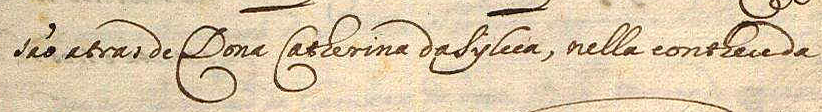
saõ atras de Dona Catherina da Sylua, nella contheuda
